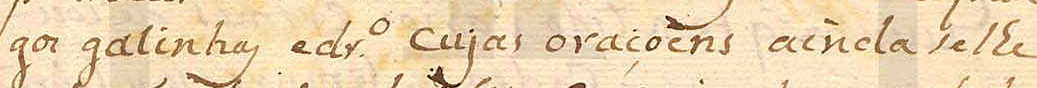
gos galinhas e dr.o cujas oraçoens ainda se lhe
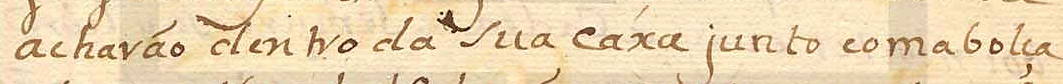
acharão dentro da sua caxa junto com a bolça,
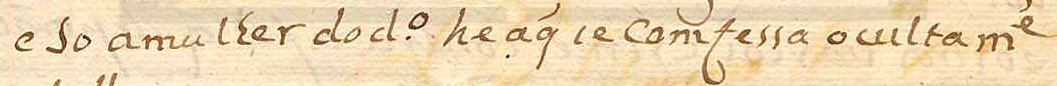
e so a mulher do d.o he a q̄ se comfessa ocultam.e
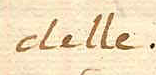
delle.
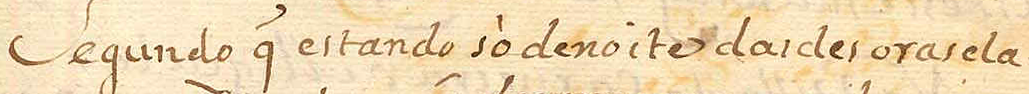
Segundo q̄ estando só de noite das des oras da
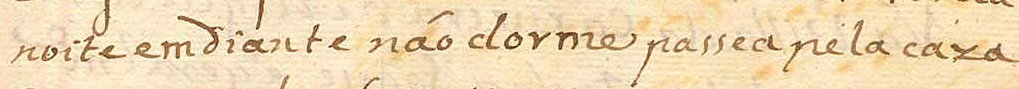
noite em diante naõ dorme passea pela caza
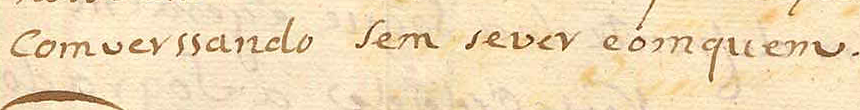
comverssando sem se ver com quem.
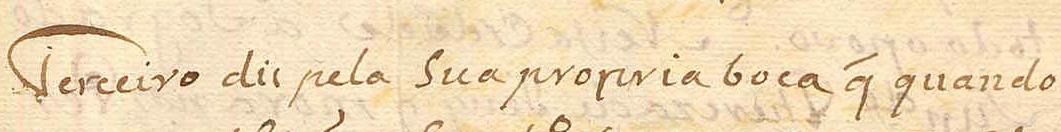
Terceiro dis pela sua propria boca q̄ quando
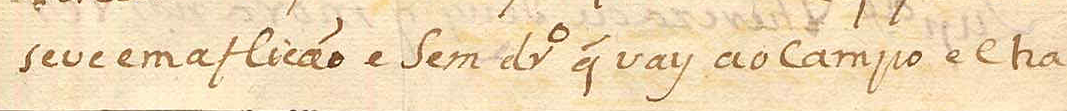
se ve em afliçaõ, e sem dr.o q̄ vay ao campo e cha
